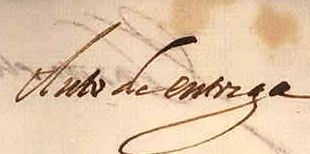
Auto de entrega
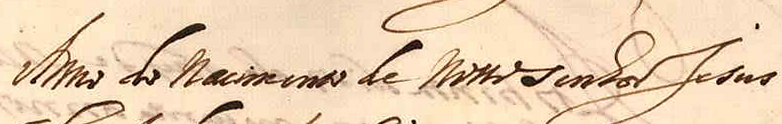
Anno do nacimento de nosso senhor Jesus
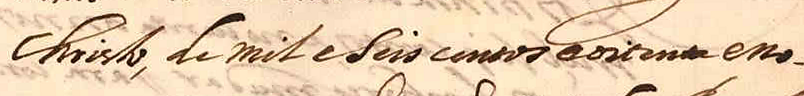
Christo, de mil e seiscentos e oitenta e no
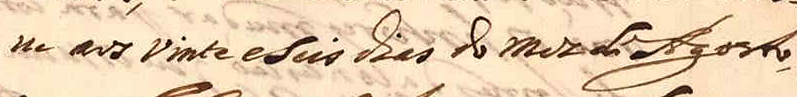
ue aos vinte e seis dias do mez de Agosto,
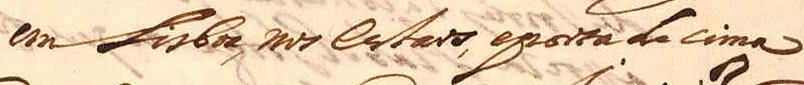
em Lisboa, nos Estaos, e porta de cima
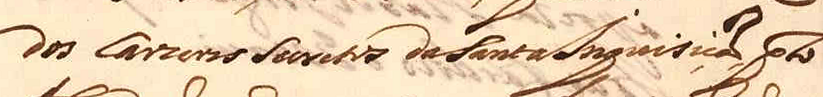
dos carceres secretos da Santa Inquisiçaõ, p̄lo
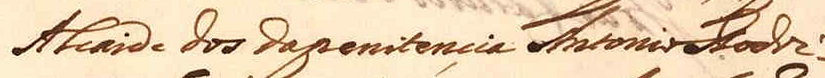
Alcaide dos da penitencia Antonio Rodri
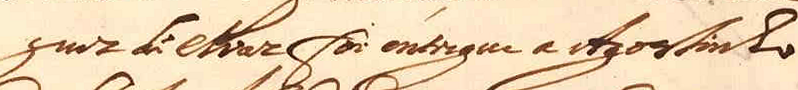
guez de elvaz foi entregue a Agostinho
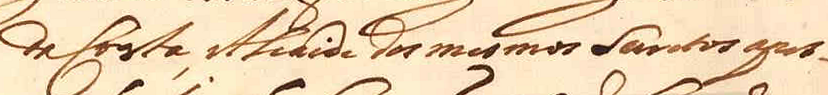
da Costa, Alcaide dos mesmos Secretos a pes
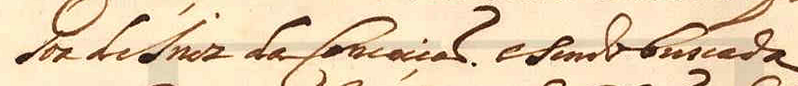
soa de Inez da Conceiçaõ. e sendo buscada
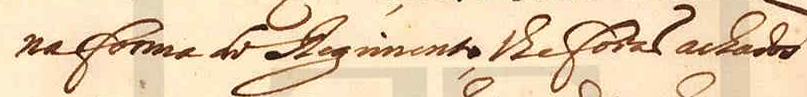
na forma do Regimento, lhe foraõ achados
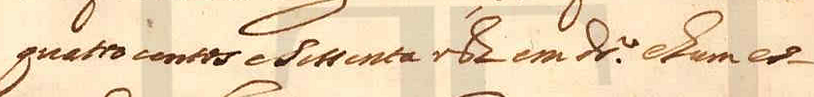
quatrocentos e sessenta rs̄ em dr.o e hum es
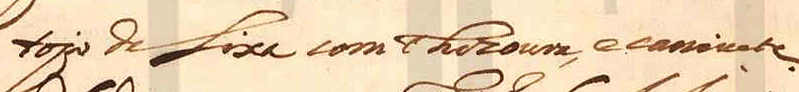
tojo de Lixa com thezoura, e caniuete
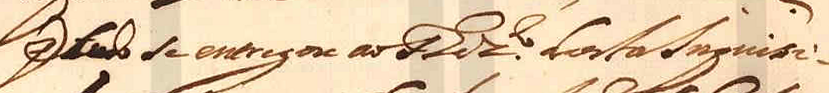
q̄ tudo se entregou ao Thez.ro desta Inquisi
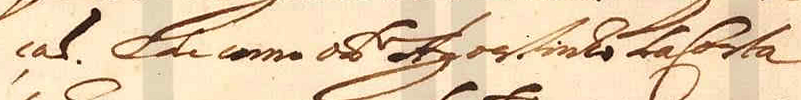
çaõ. E de como o d̄o Agostinho da Costa
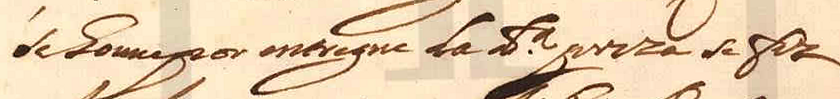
se houue por entregue da d̄.a preza se fez
